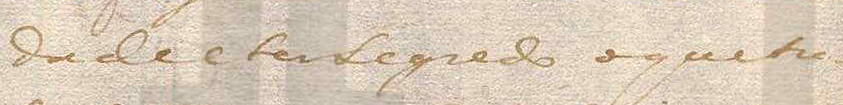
dade e ter segredo o que tu
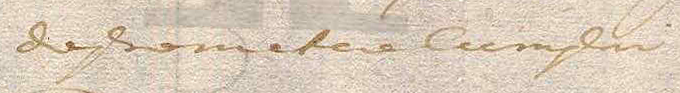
do prometeo cumpri
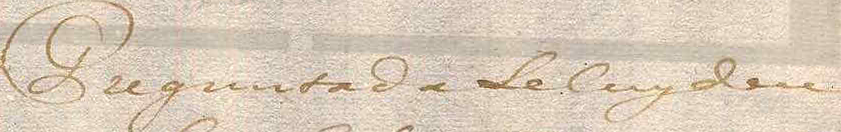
Preguntada se cuydou
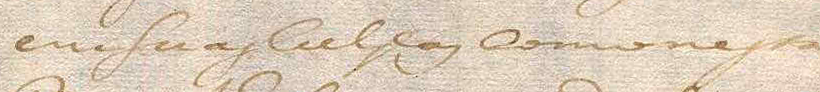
em suas Culpas como nesta
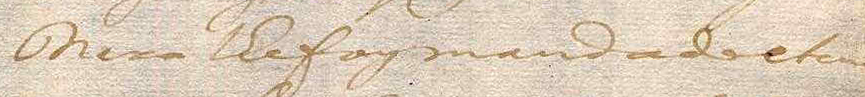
Meza lhe foy mandado e tem
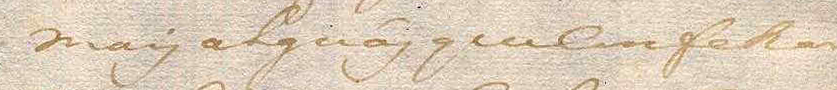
mais alguās que confessar
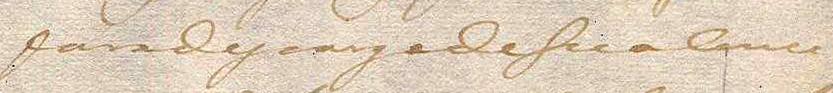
para descargo de sua conci
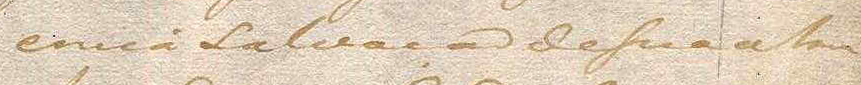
encia salvaçaõ de sua alma
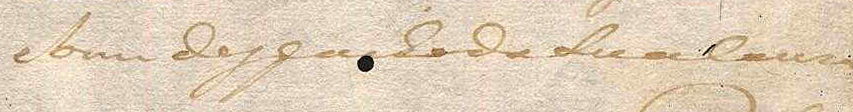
e bom despacho de sua cauza
